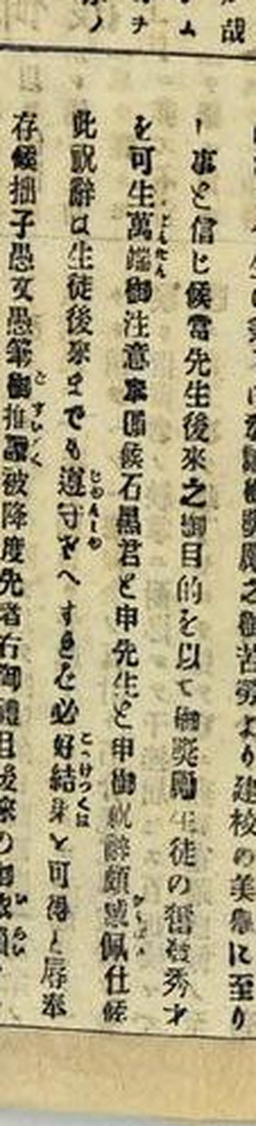を可生万端御注意奉願候石黒君と申先生と申御祝辞頗感佩仕候
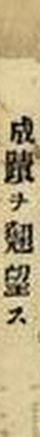成蹟ヲ翹望ス
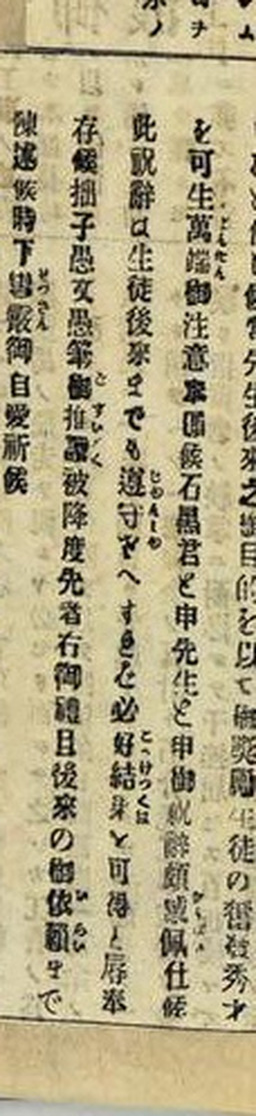此祝辞は生徒後来までも遵守さへすれば必好結果を可得と辱奉
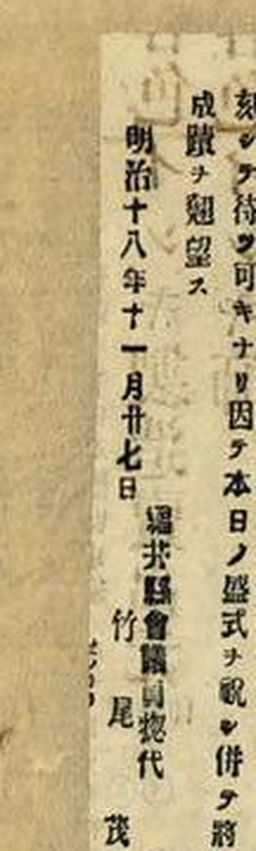明治十八年十一月廿七日福井県会議員惣代
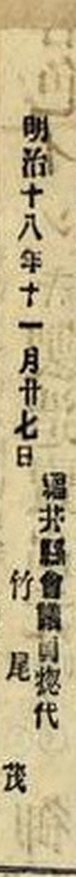明治十八年十一月廿七日福井県会議員惣代
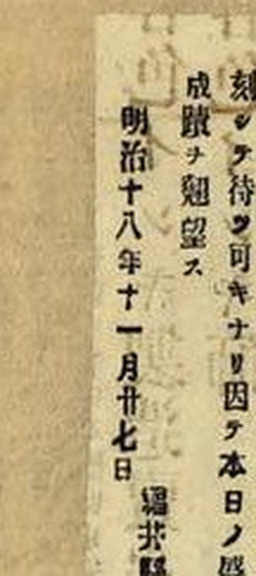明治十八年十一月廿七日
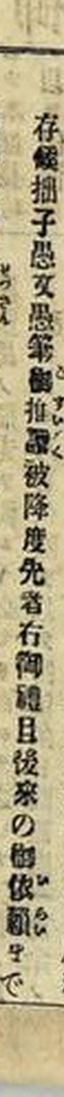存候拙子愚文愚筆御推読被降度先は右御礼且後来の御依頼まで
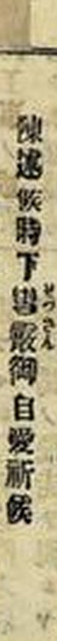陳述候時下雪霰御自愛祈候
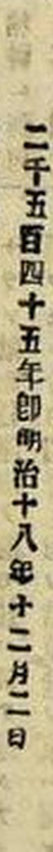二千五百四十五年即明治十八年十二月二日
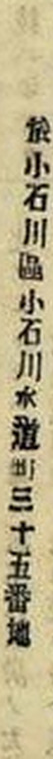於小石川区小石川水道町三十五番地
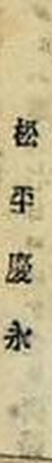松平慶永

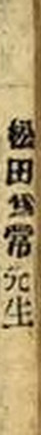松田為常先生
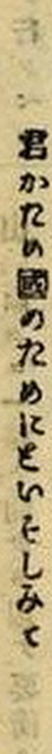君かため国のためにといそしみて
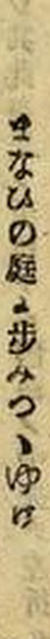まなひの庭に歩みつゝゆけ
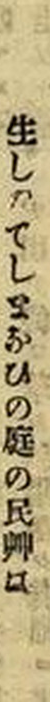生したてしまなひの庭の民草は
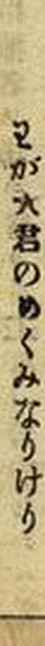わが大君のめくみなりけり
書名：温古集 五巻
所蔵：福井県文書館 Fukui Prefectural Archives
